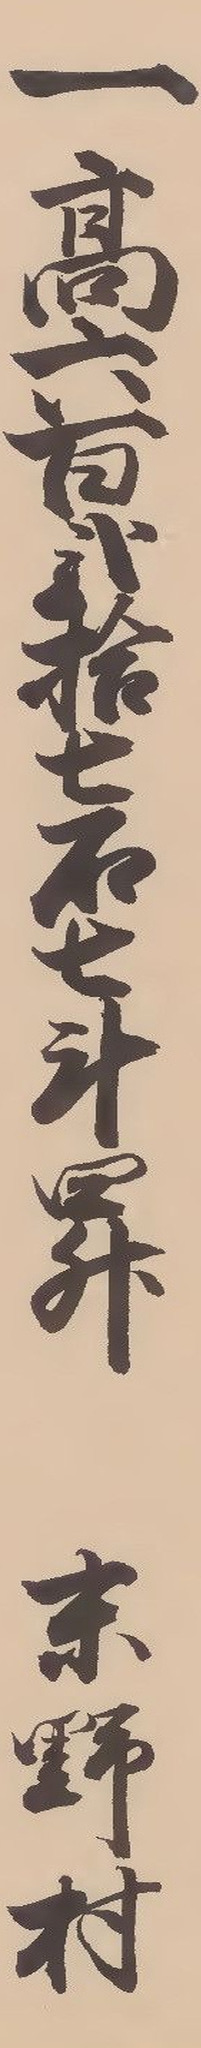一高六百弐拾七石七斗四升末野村
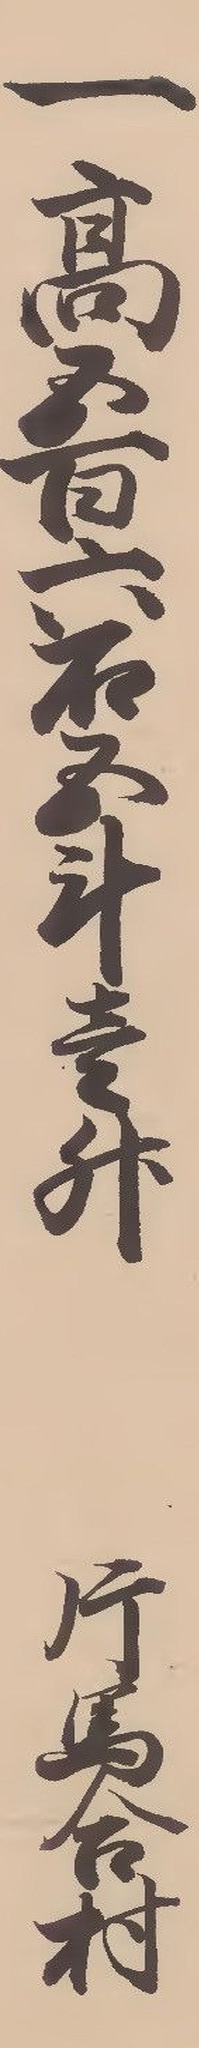一高五百六石五斗壱升片馬合村
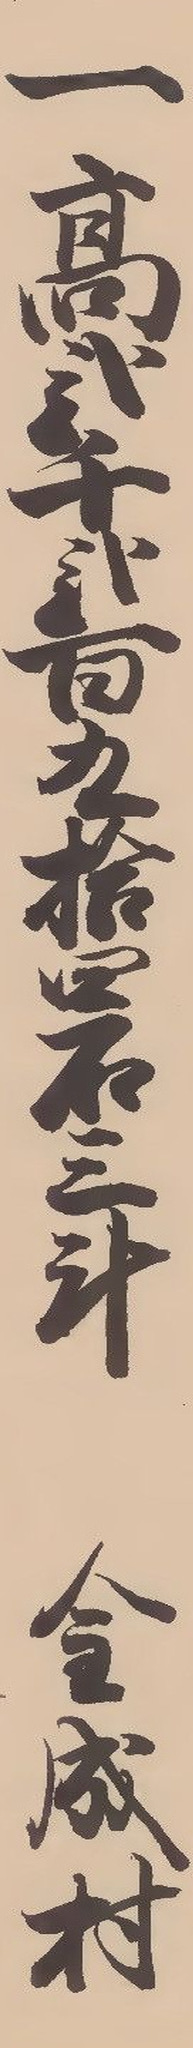一高弐千弐百九拾四石三斗金成村
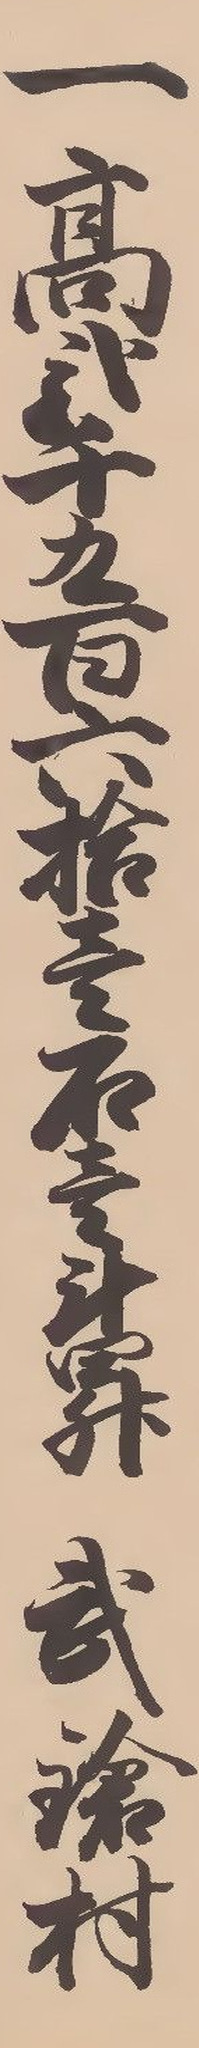一高弐千九百六拾壱石壱斗四升武鎗村
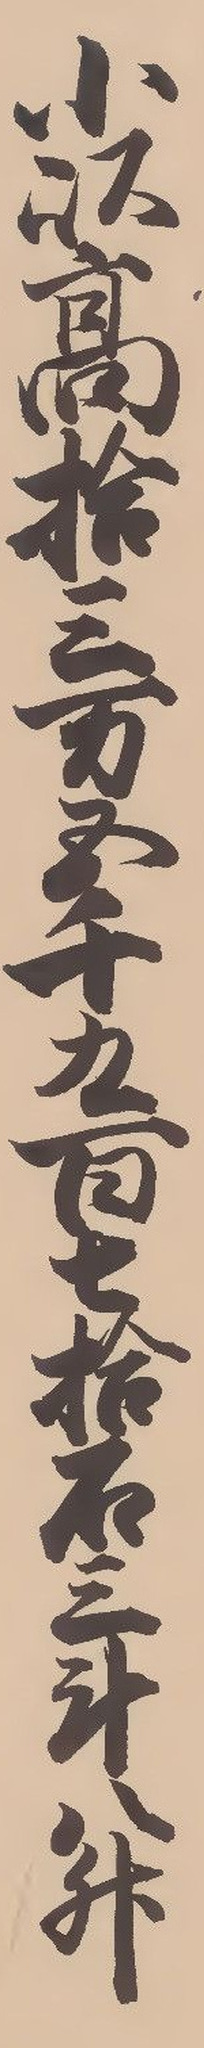小以高拾三万五千九百七拾石三斗八升

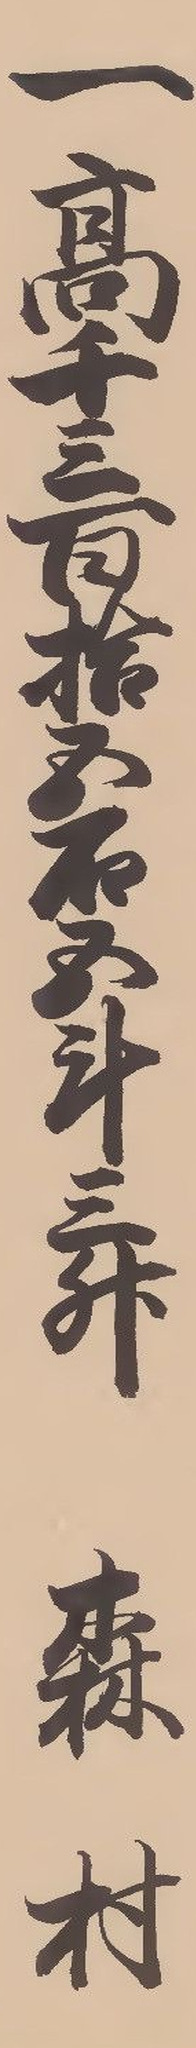一高千三百拾五石五斗三升森村
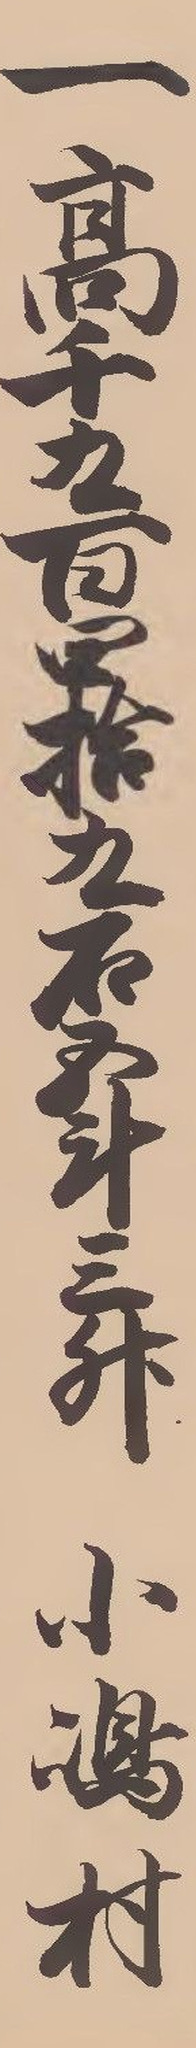一高千九百四拾九石五斗三升小島村
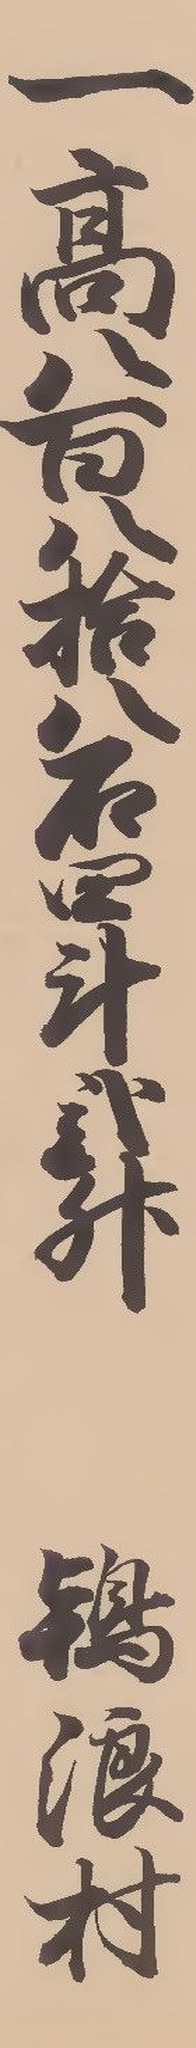一高八百八拾八石四斗弐升鴇浪村
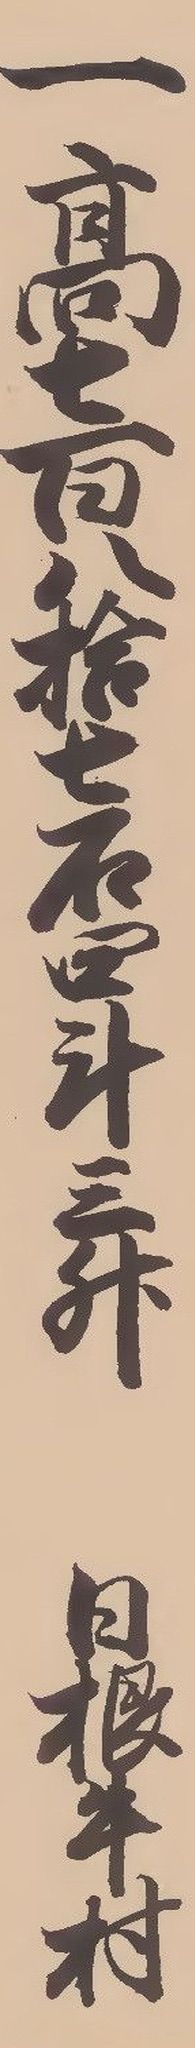一高七百八拾七石四斗三升日根牛村

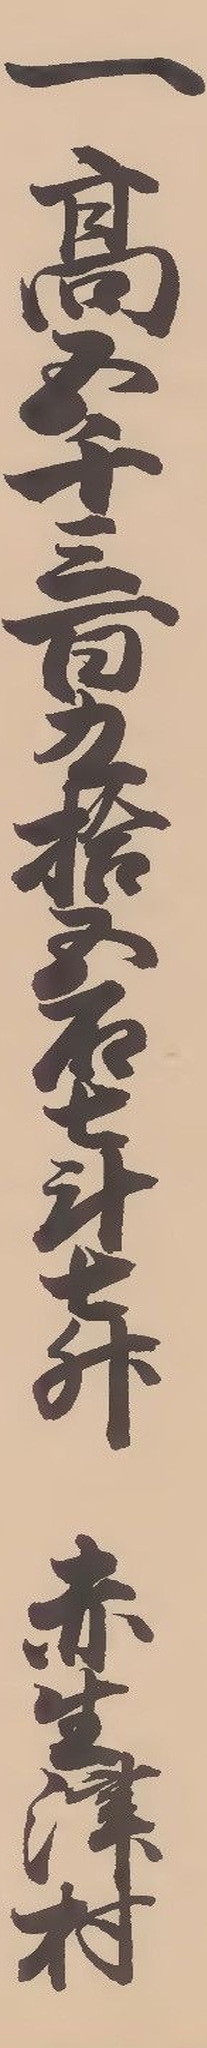一高五千三百九拾五石七斗七升赤生津村
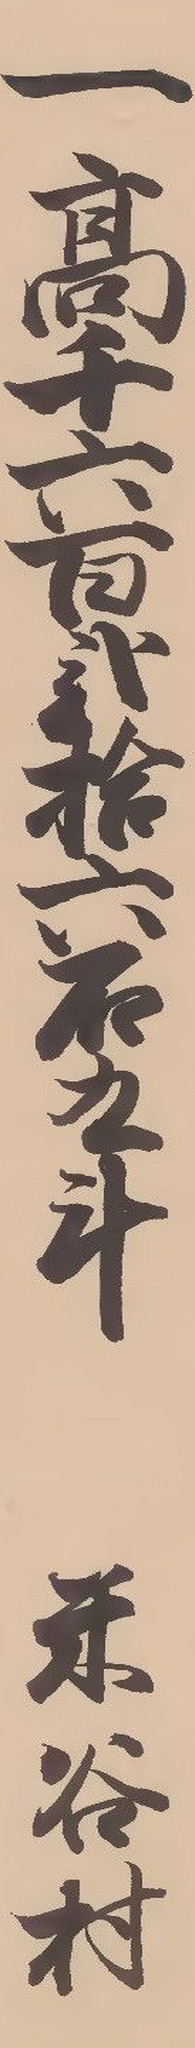一高千六百弐拾六石九斗米谷村
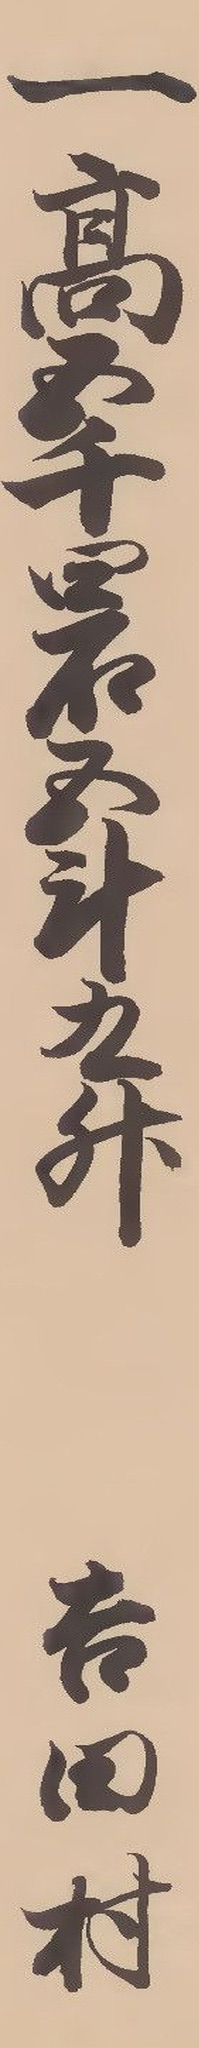一高五千四石五斗九升吉田村
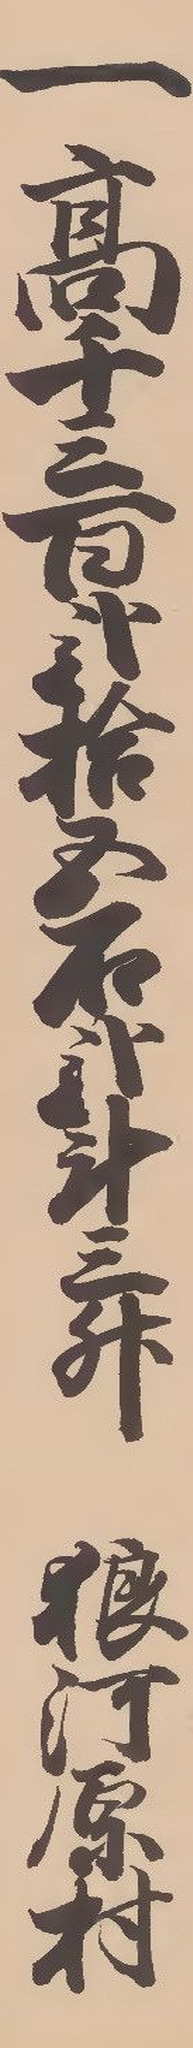一高千三百弐拾五石弐斗三升狼河原村
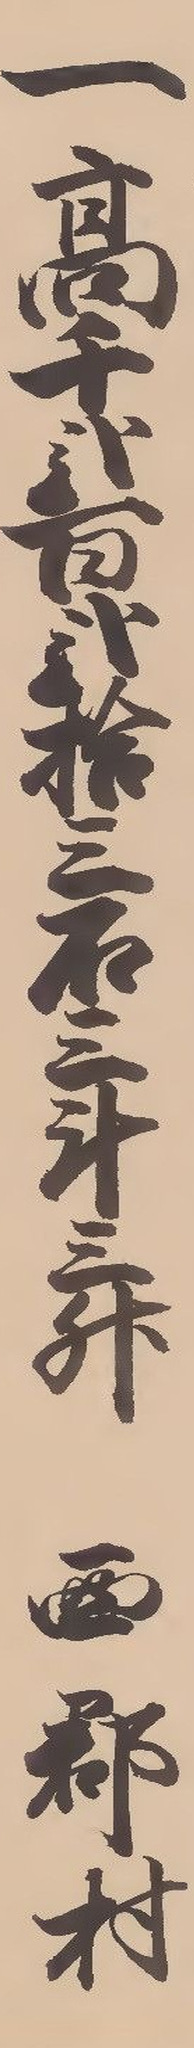一高千弐百弐拾三石三斗三升西郡村
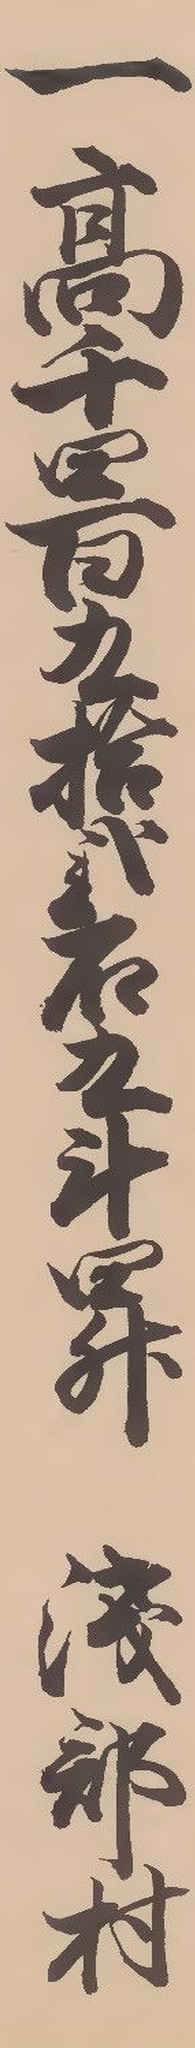一高千四百九拾弐石九斗四升浅部村
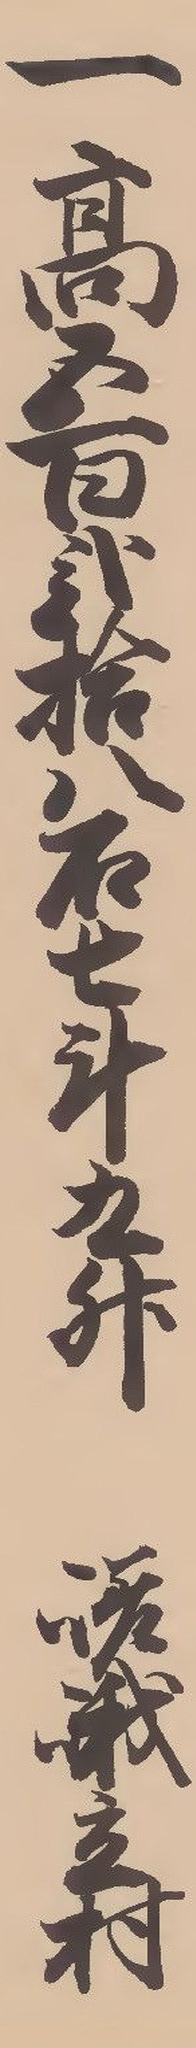一高五百弐拾八石七斗九升嵯峨立村
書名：陸奥国郷帳　５
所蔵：国立公文書館 National Archives of Japan
